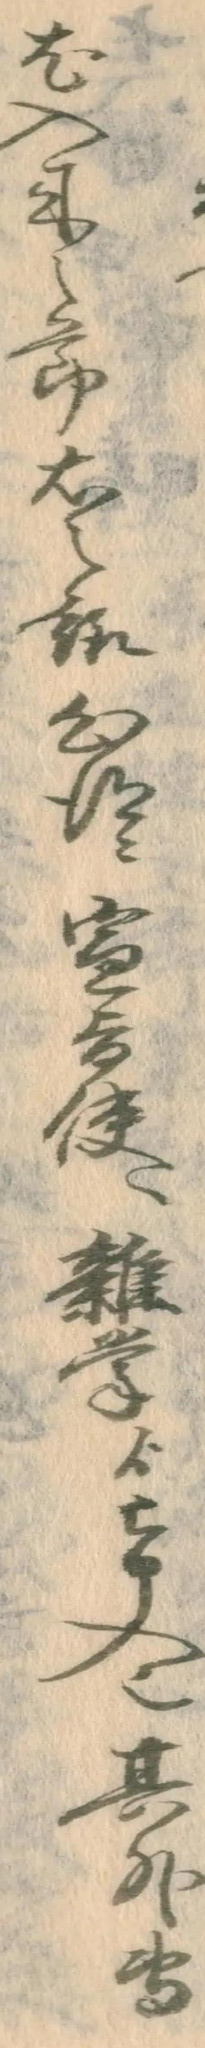尤入来之節右之趣心得ニ宣旨使へ雑掌ゟ被申入也其外専
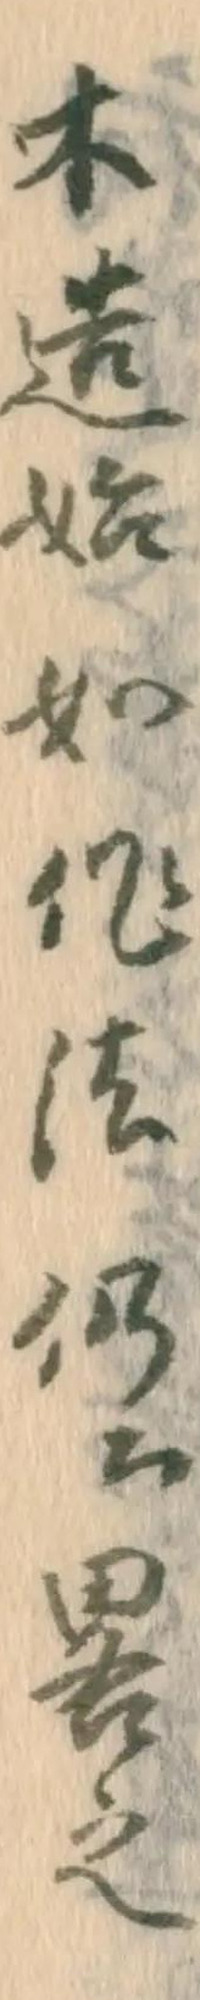木造始如作法仍而略之
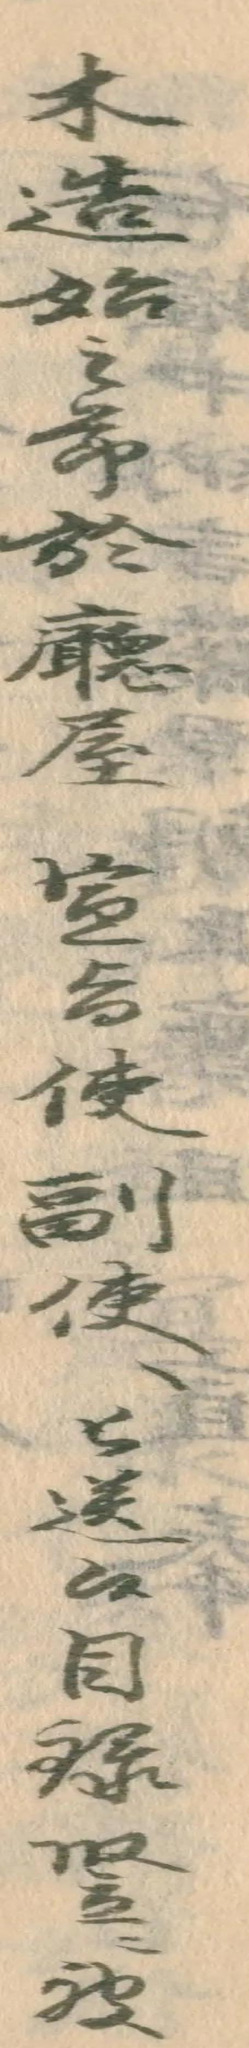一木造始之節於庁屋宣旨使副使へ被送候目録竪ニ致
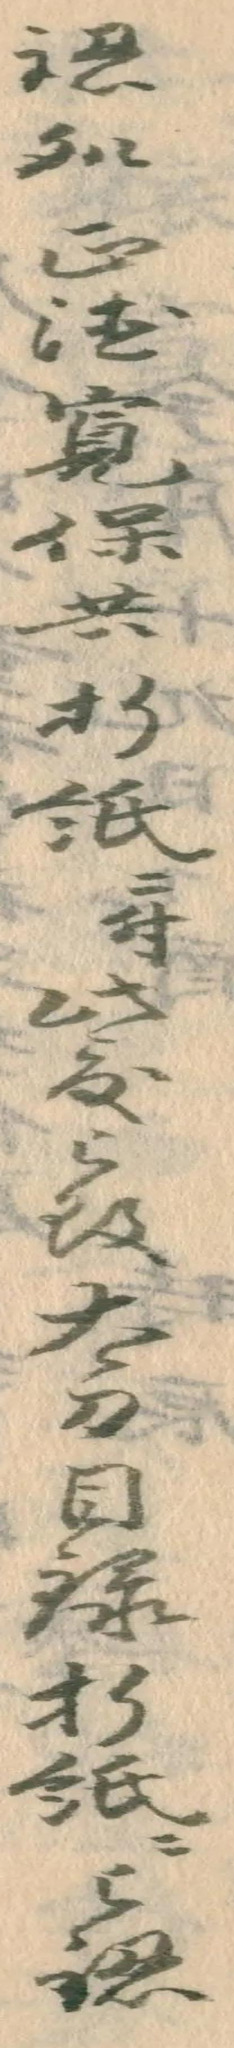認処正徳寛保共折紙ニ付此度被改太刀目録折紙ニ被認
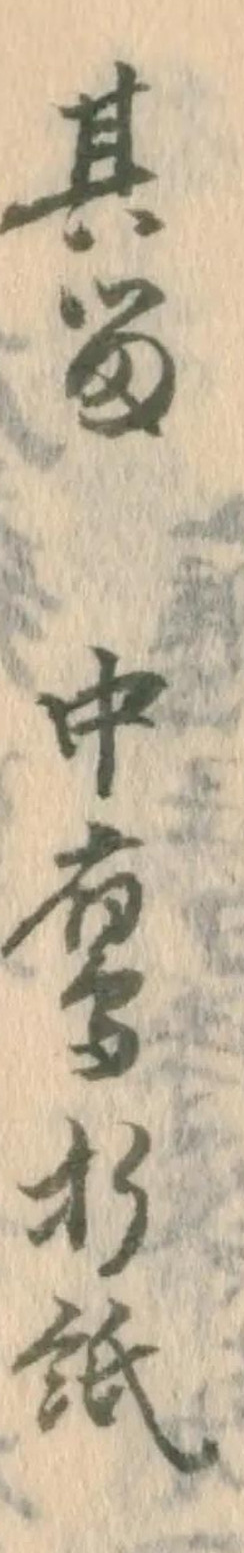其留中厚折紙
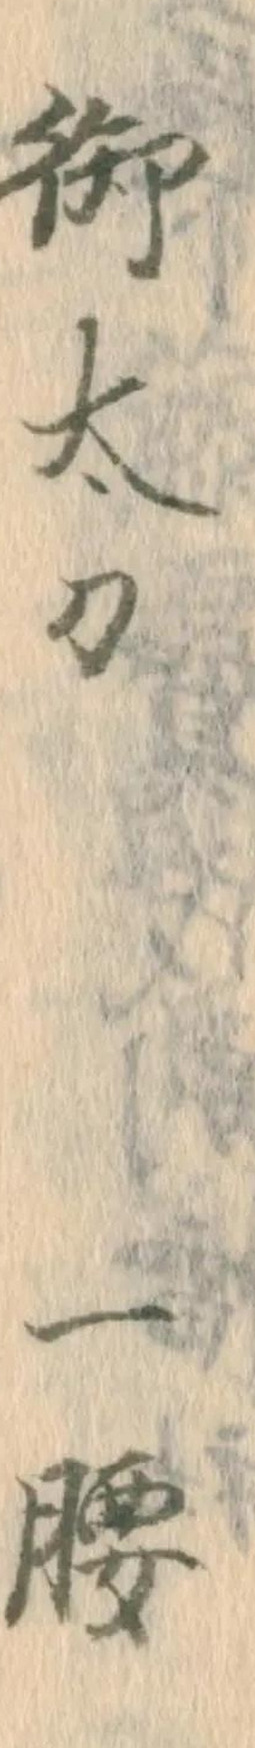御太刀一腰
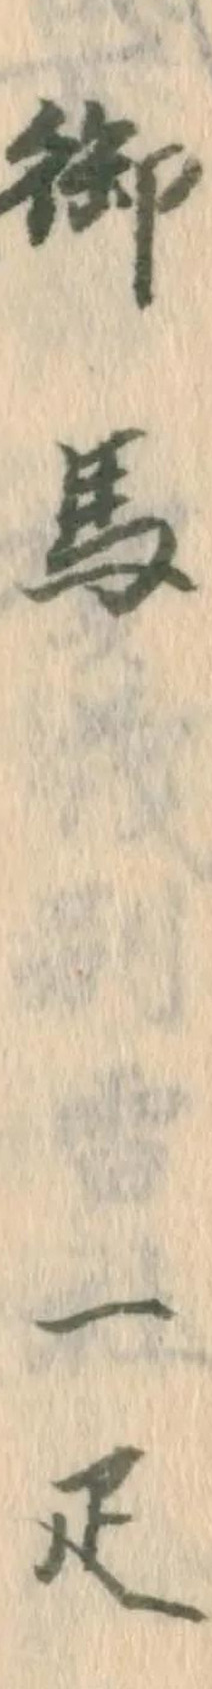御馬一疋
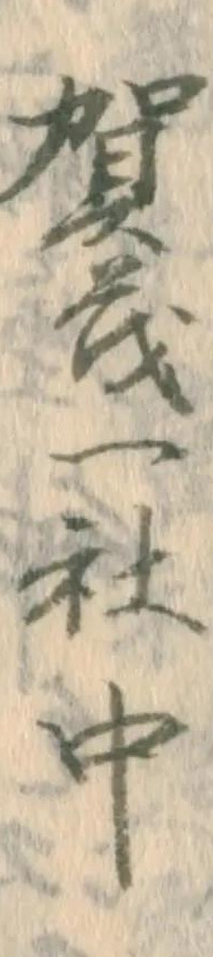賀茂一社中
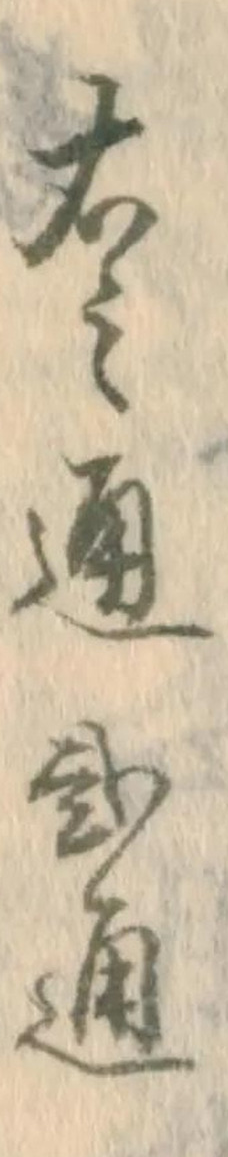右之通弐通
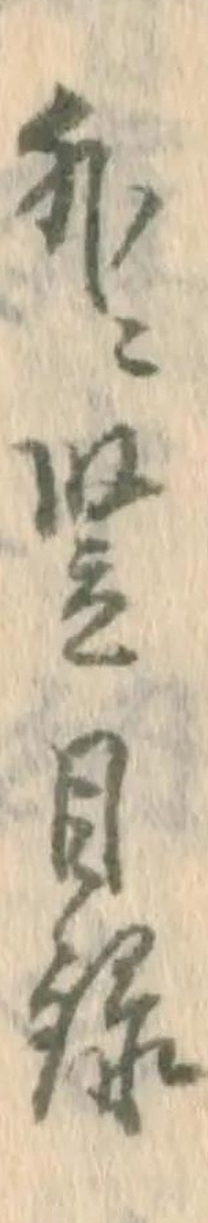外ニ竪目録
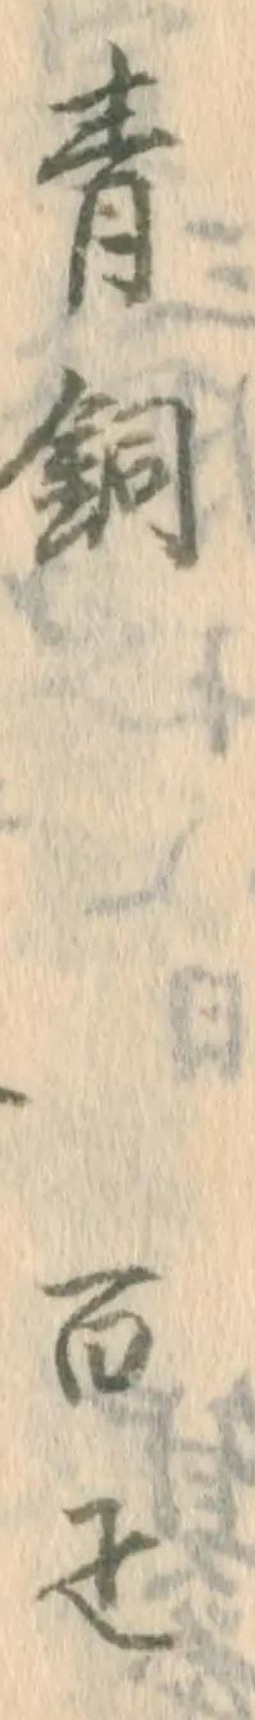青銅百疋
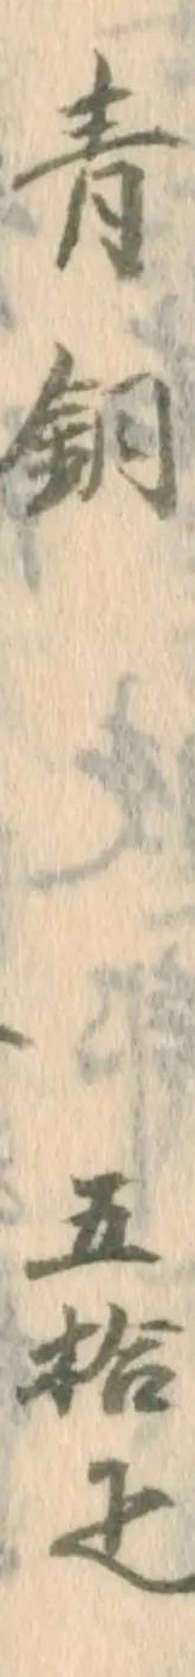青銅五拾疋
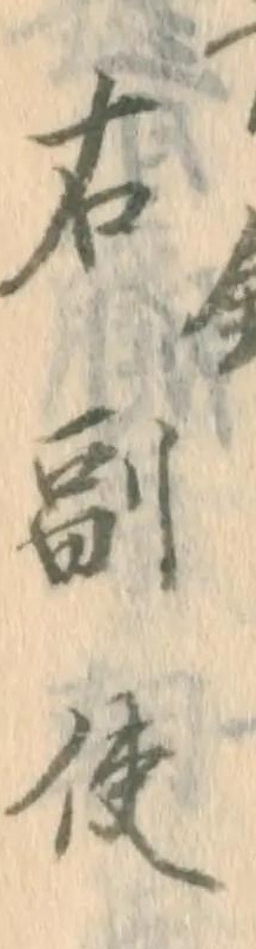右副使

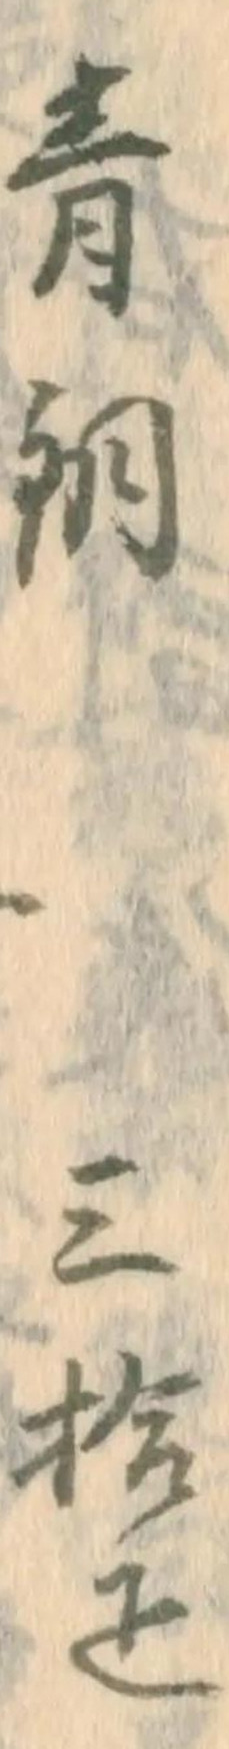青銅三拾疋
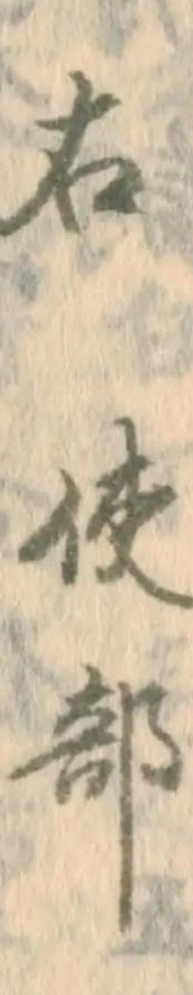右使部
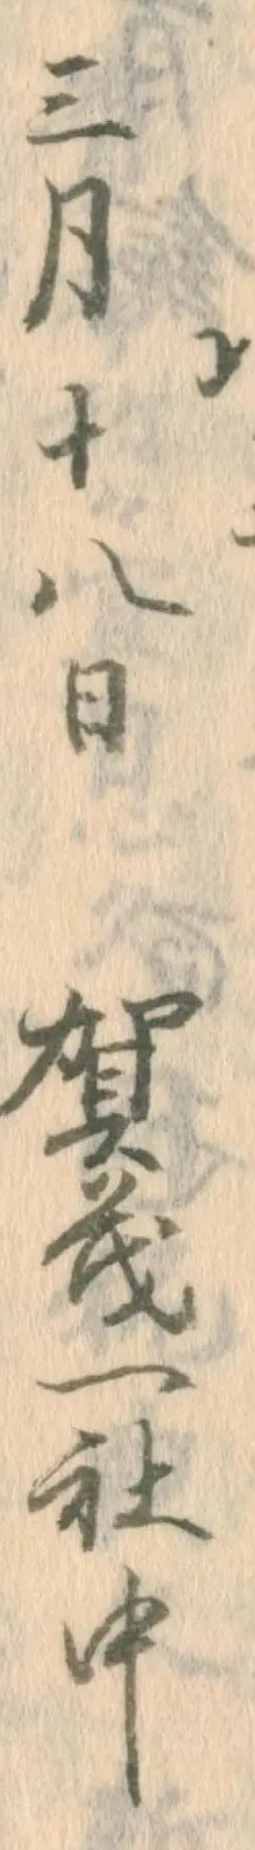三月十八日賀茂一社中
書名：賀茂社記録. 第17冊
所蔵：国立国会図書館 National Diet Library, JAPAN
